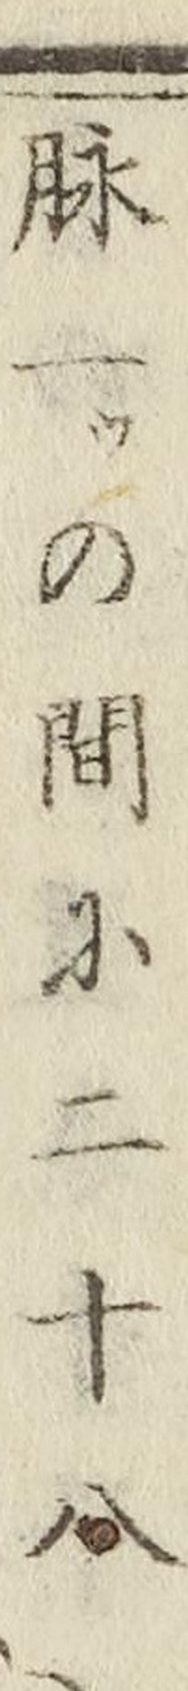脈一ツの間に二十八
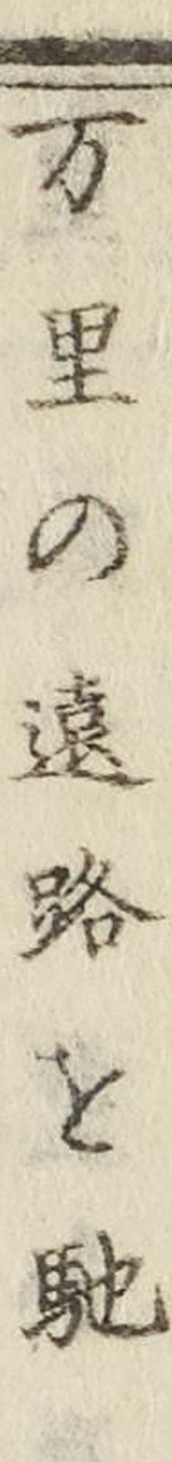万里の遠路を馳
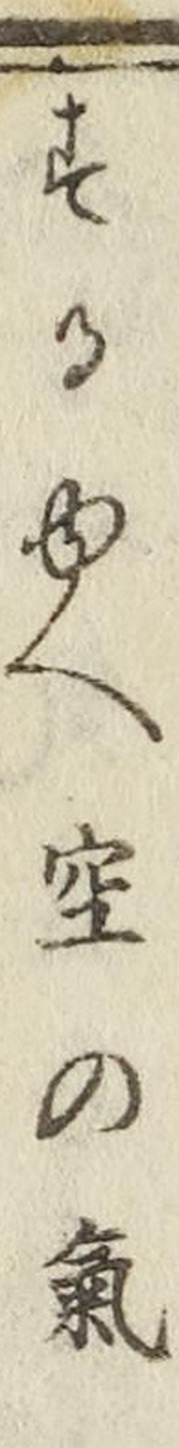するゆへ空の気
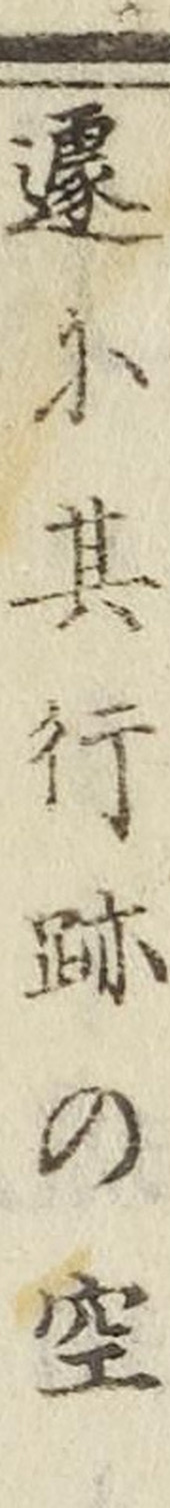遽に其行跡の空
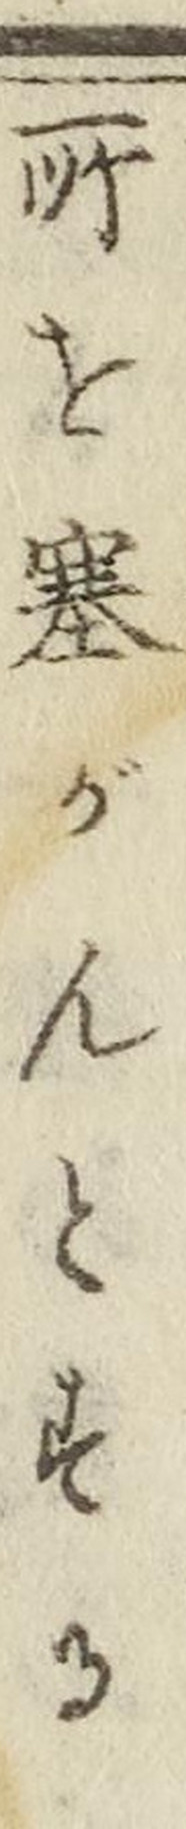所を塞がんとする
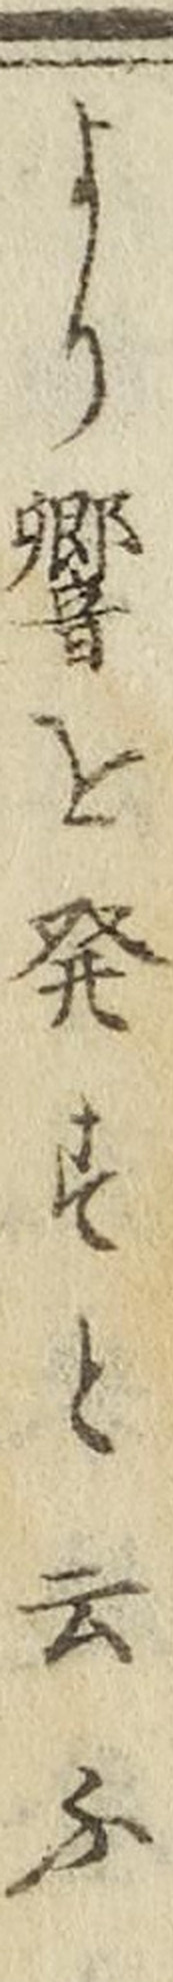より響を発すと云ふ

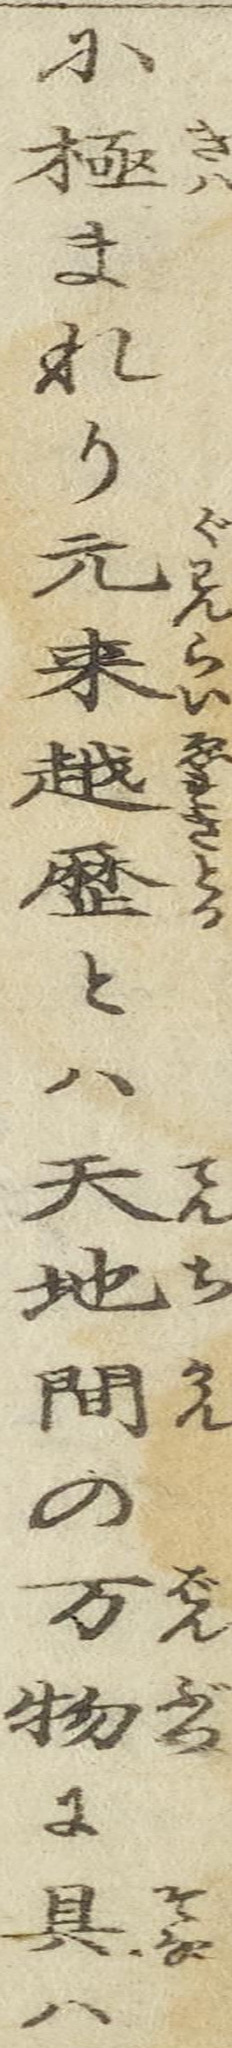に極まれり元来越歴とは天地間の万物に具は
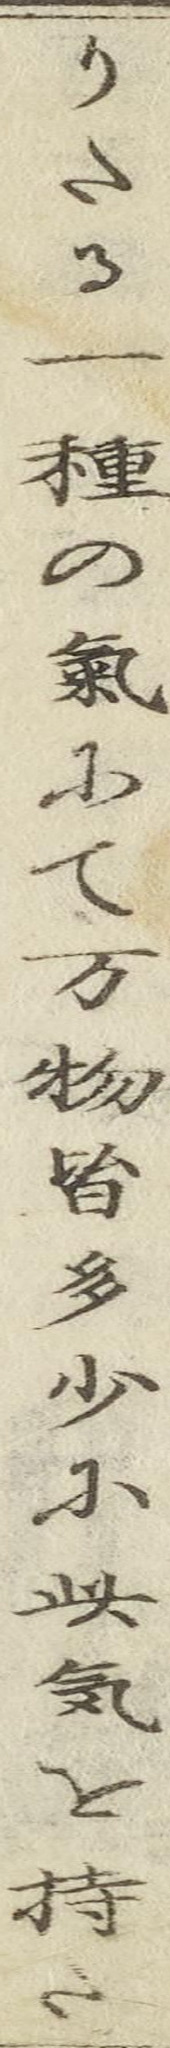りたる一種の気にて万物皆多少に此気を持た
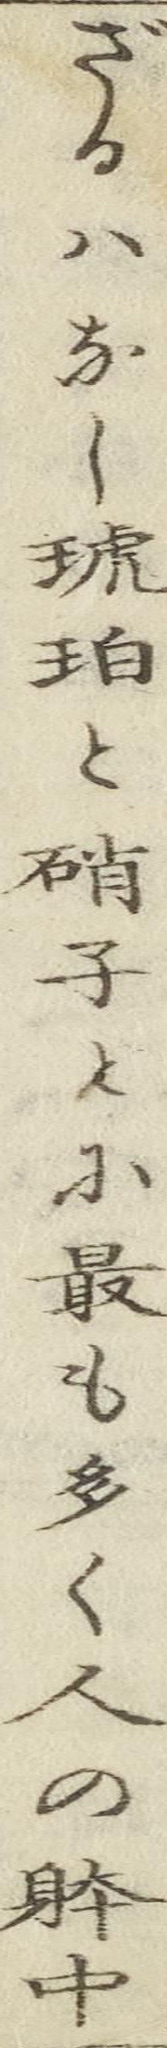ざるはなし琥珀と硝子とに最も多く人の体中
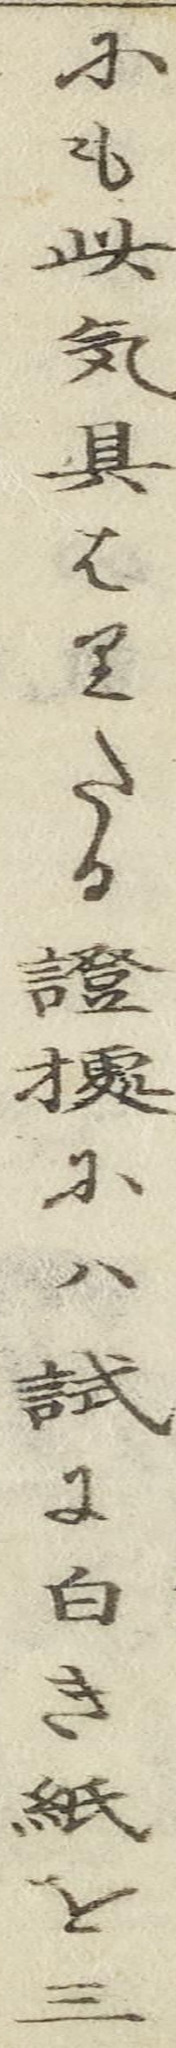にも此気具はりたる証拠には試に白き紙を三
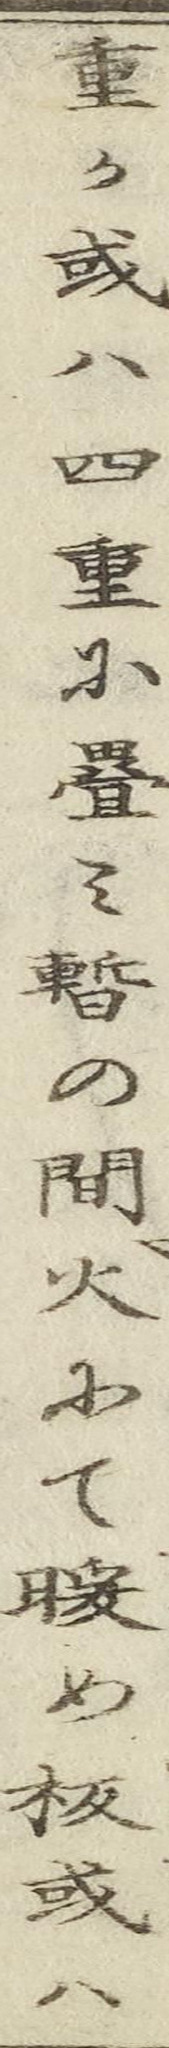重か或は四重に畳み暫の間。火にて暖め板或は
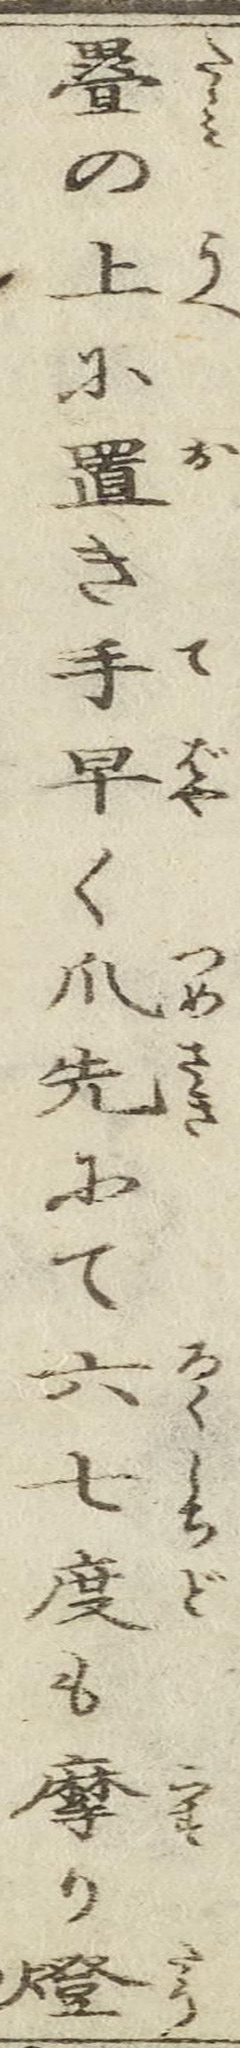畳の上に置き手早く爪先にて六七度も摩り灯
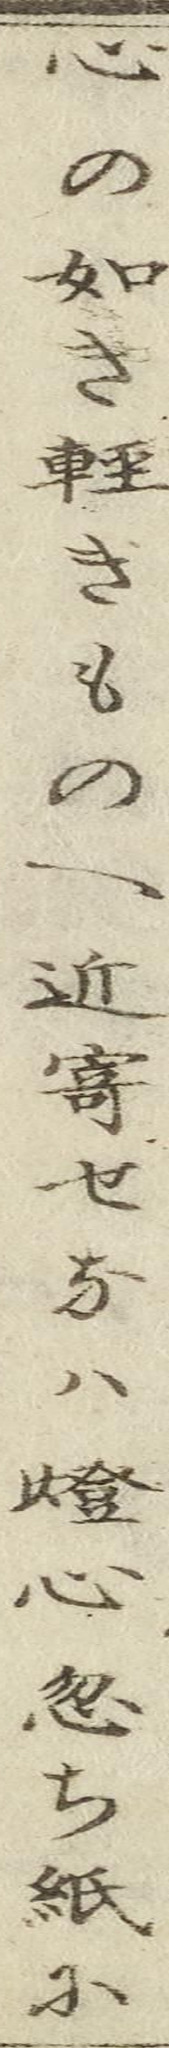心の如き軽きものへ近寄せなは灯心忽ち紙に
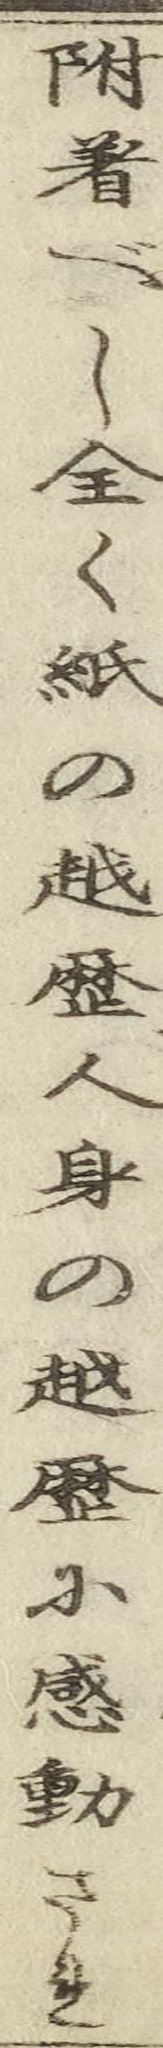附着べし全く紙の越歴。人身の越歴に感動され
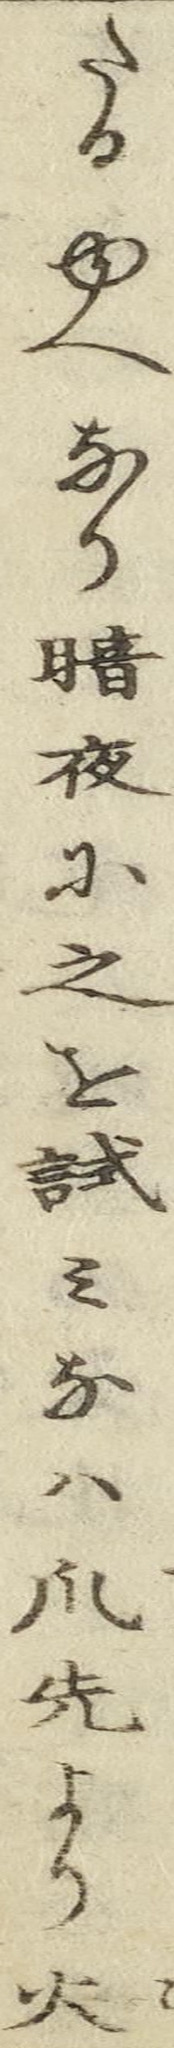たるゆへなり暗夜に之を試みなは爪先より火
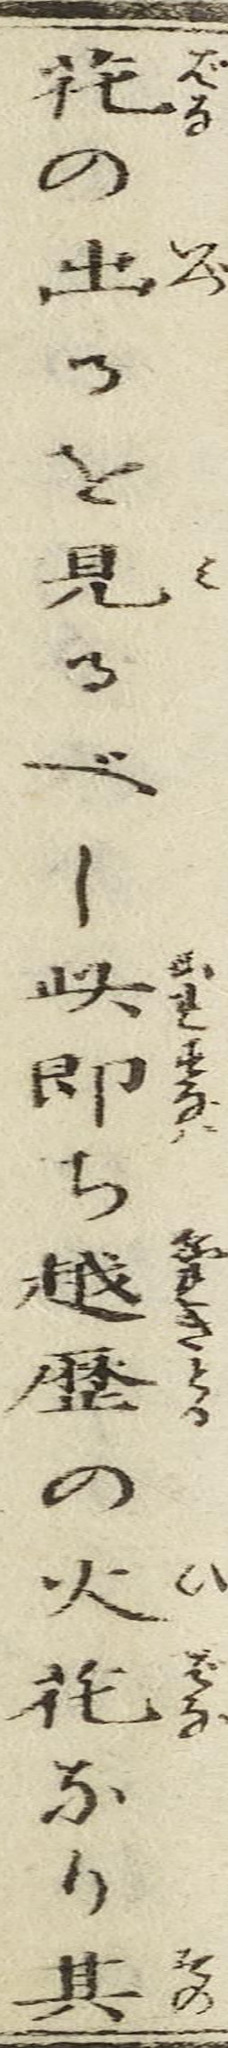花の出るを見るべし此即ち越歴の火花なり其
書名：天変地異
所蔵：東京大学地震研究所図書室 Earthquake Research Institute Library, The University of Tokyo, JAPAN
